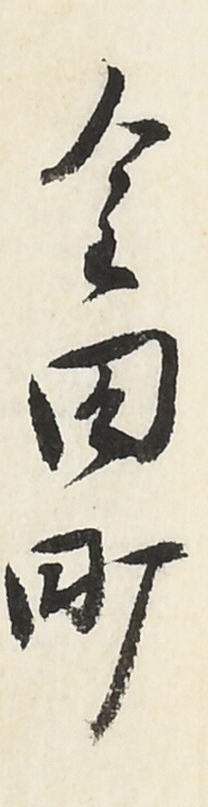金田町
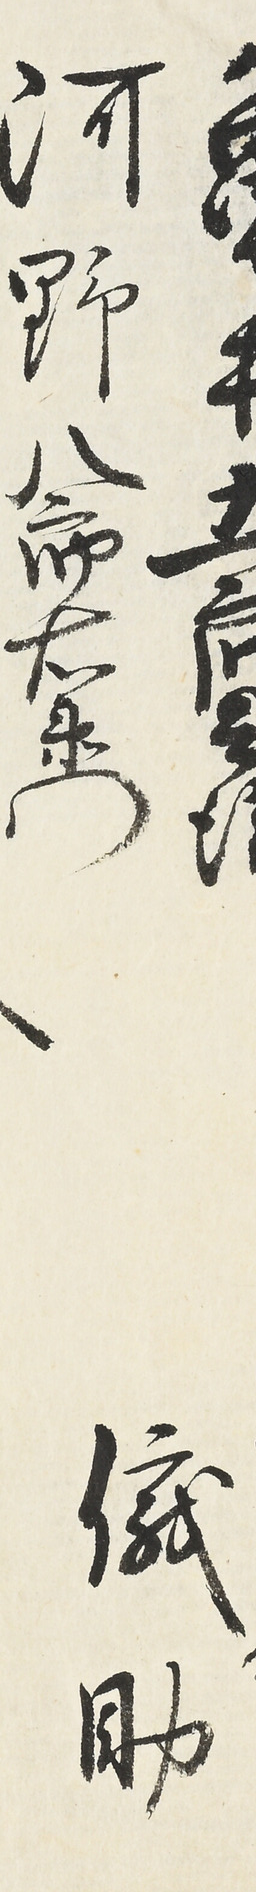河野八郎右衛門儀助
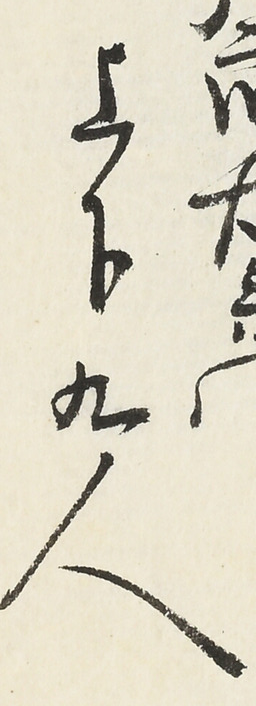上下九人
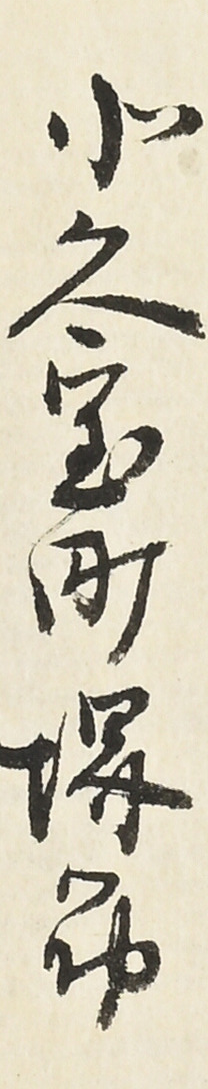北久宝寺堺筋
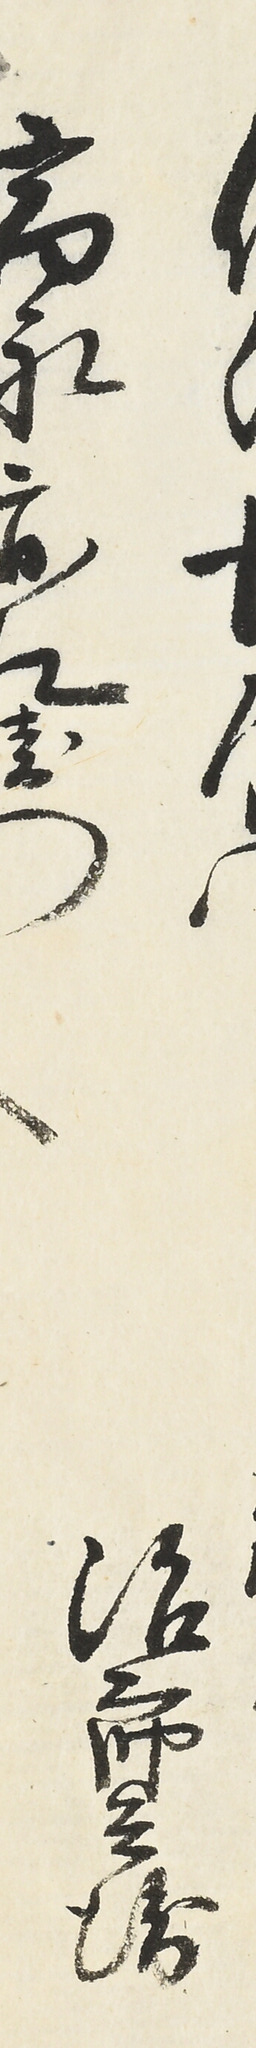富永亦左衛門治郎兵衛
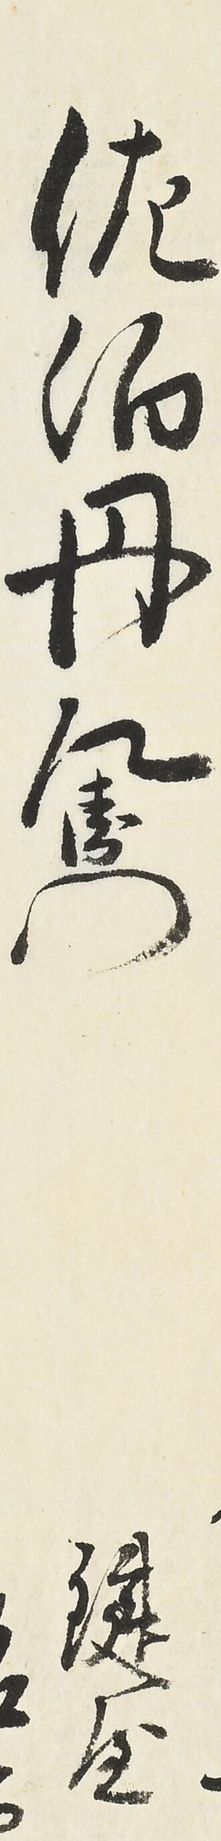一佐伯丹左衛門鍵屋
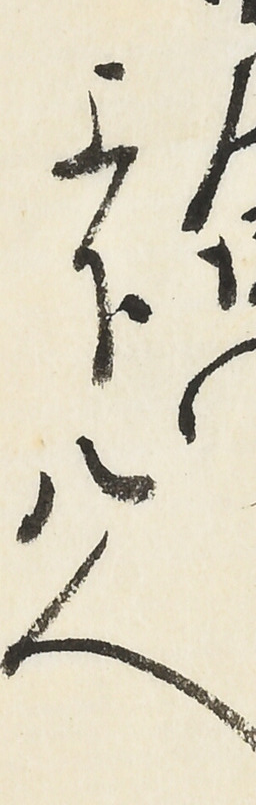上下八人
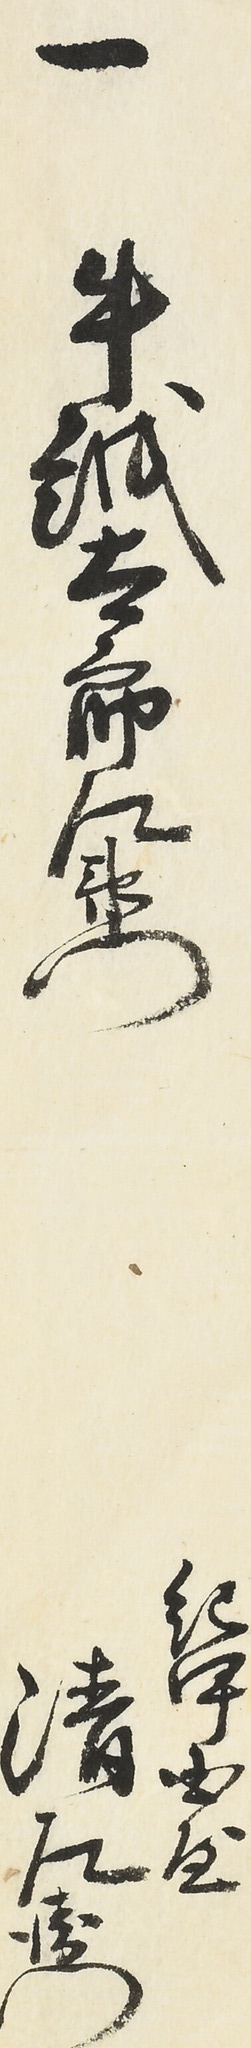一牛越太郎左衛門紀伊国屋
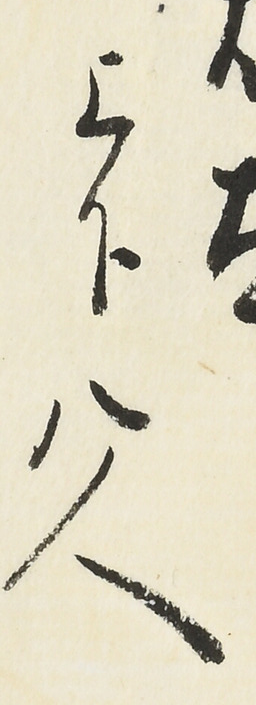上下八人
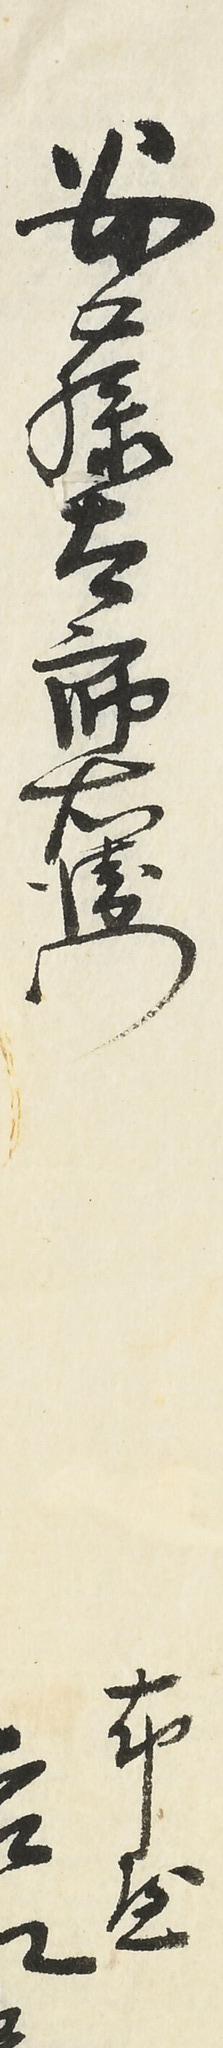一安藤太郎右衛門布屋
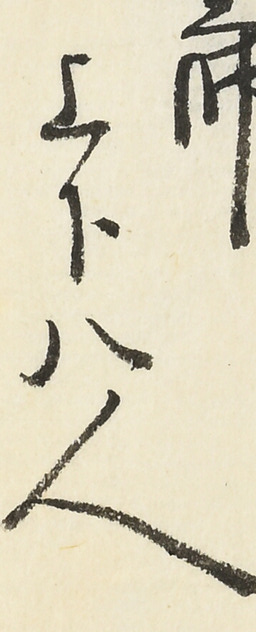上下八人

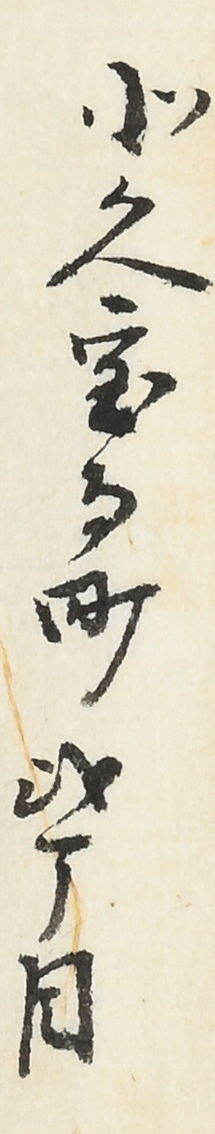北久宝寺町弐丁目
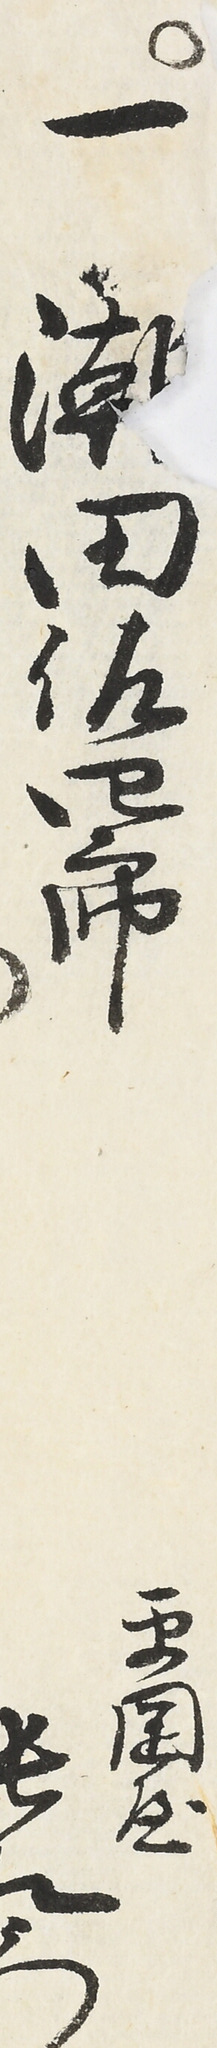〇一潮田佐四郎平岡屋
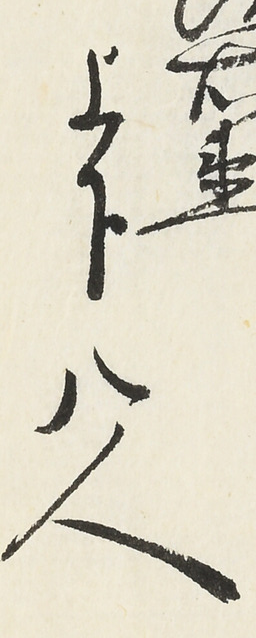上下八人
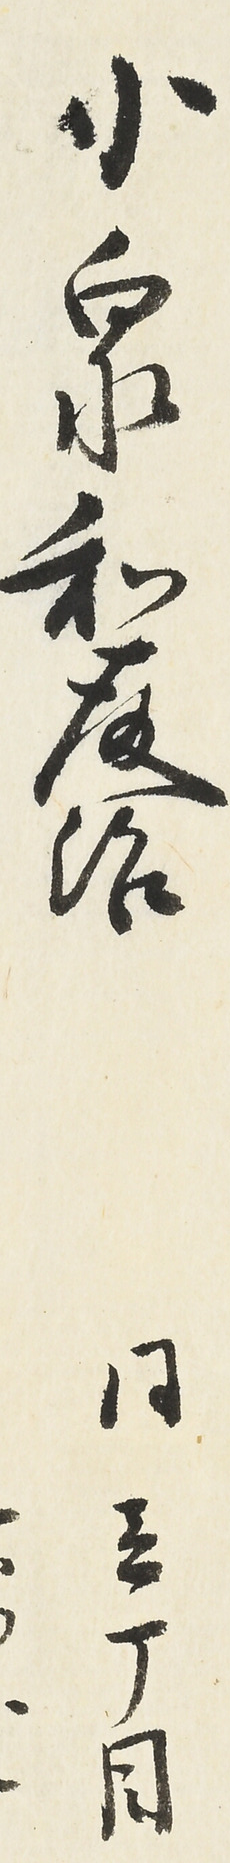小泉和籐治同壱丁目
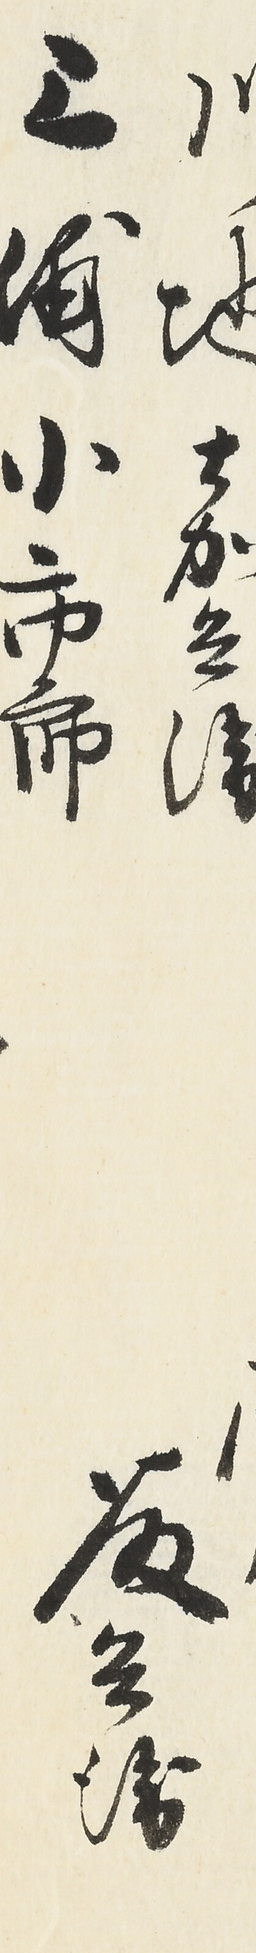三浦小市郎籐兵衛
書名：内藤大和守下宿割
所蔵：伊那市立高遠町図書館・合同会社AMANE
